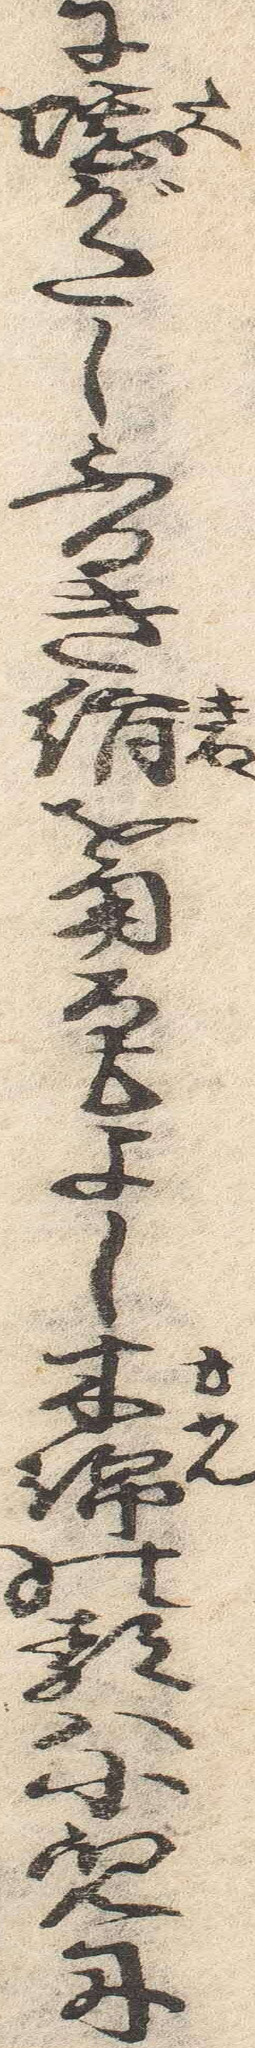に堪がたしふるき絹を用るもよし木綿の類は小児に
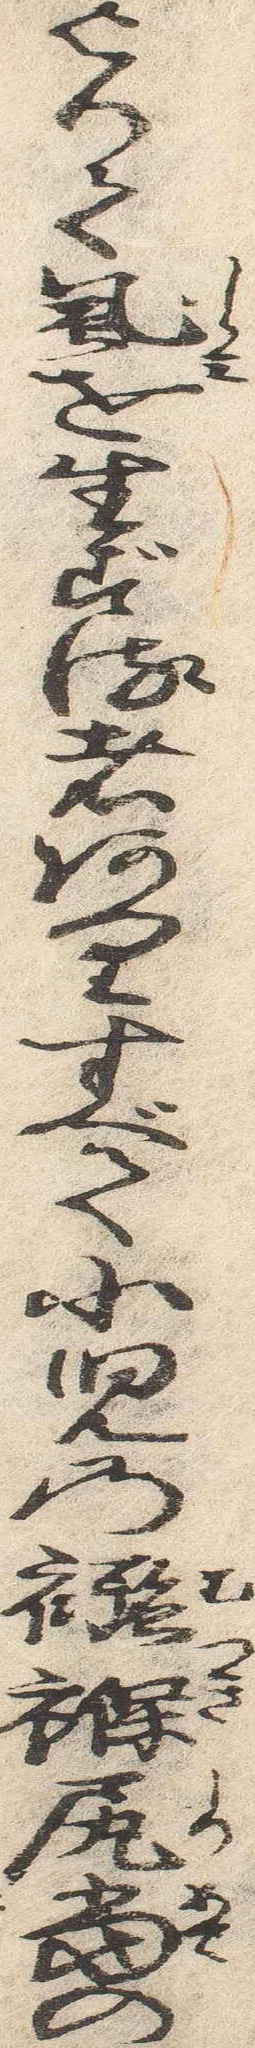よりて虱を生ずる者ありすべて小児の襁褓尻當の
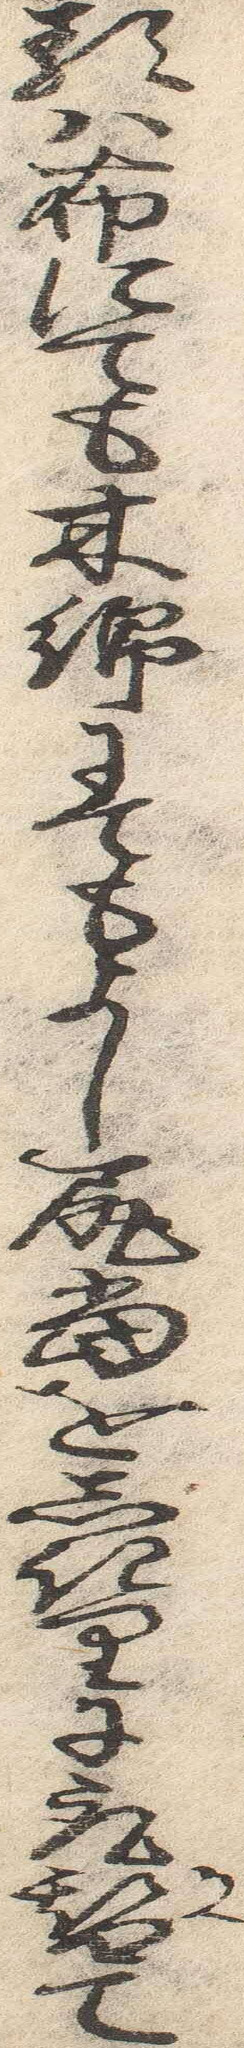類は布にても木綿にてもよし尻當をしきりに取替て
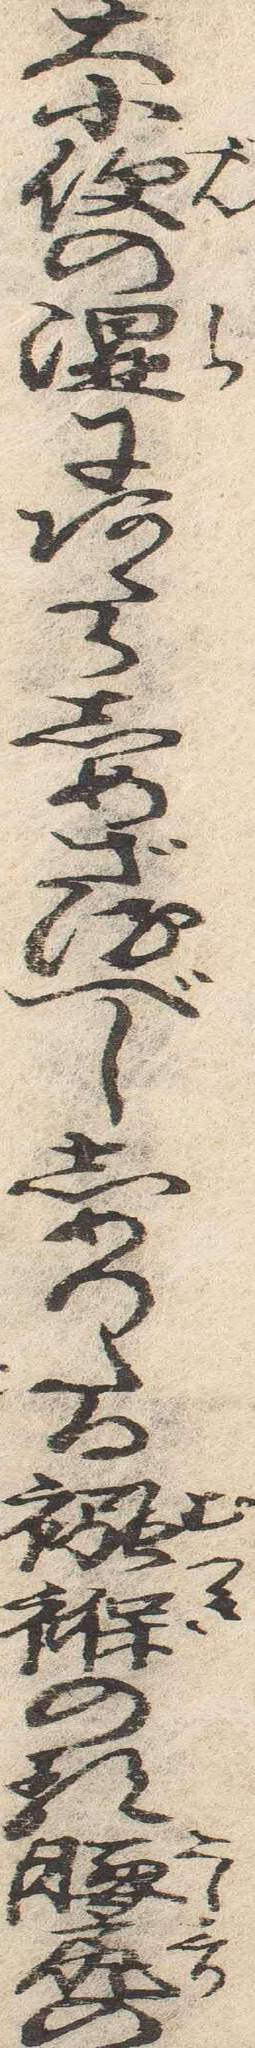大小便の湿にあたりしめざるべししめりたる襁褓の類腰尻の
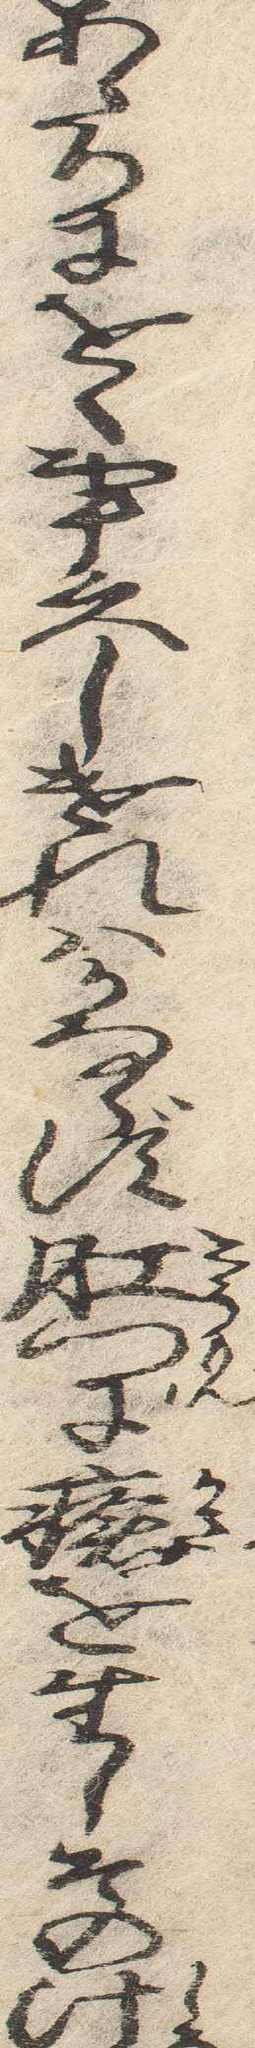あたりにをく事久しけれはかならず肛門に瘡を生しその汁
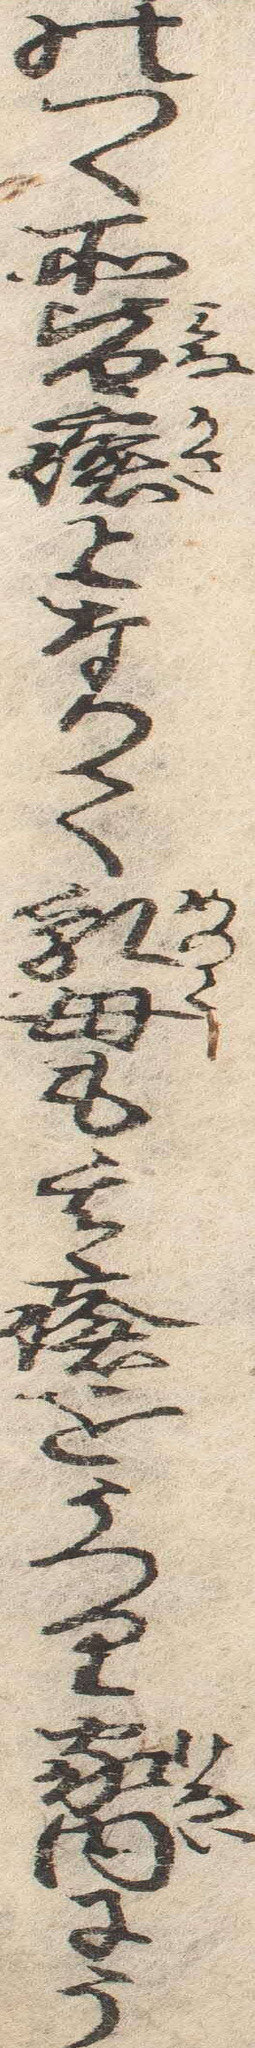のつく所皆瘡となりて乳母も其瘡をうつり家内にう
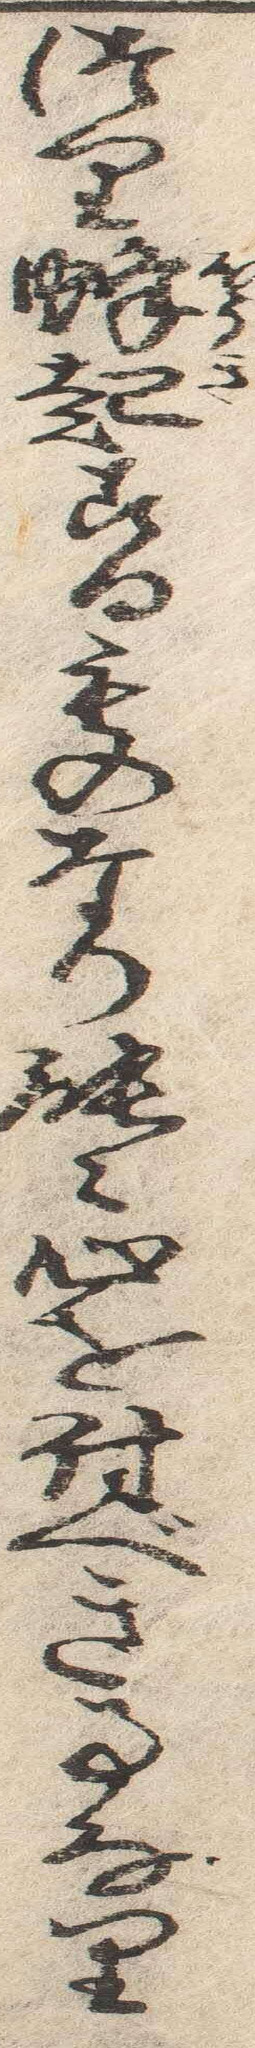つり蜂起するものなり能々心を付べき事なり
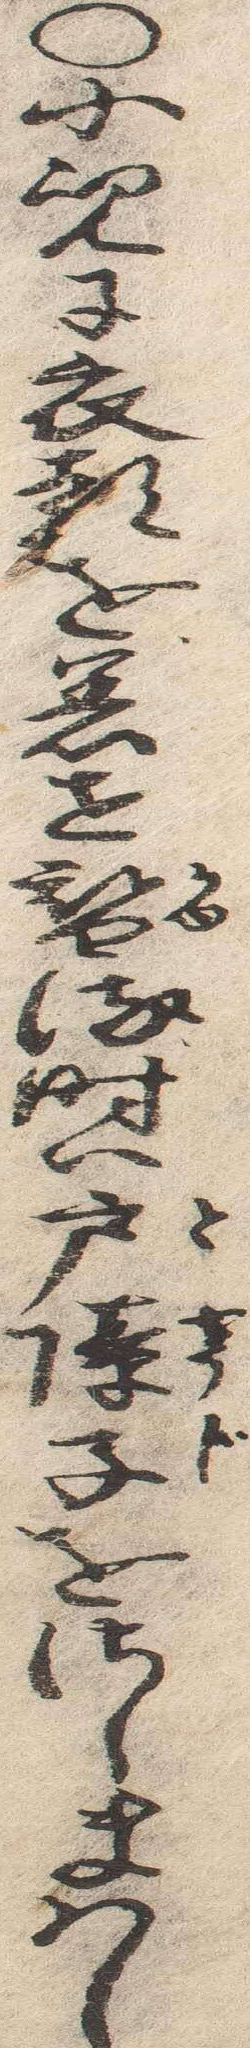◯小児に衣類を着せ替る時は戸障子をさしまはし
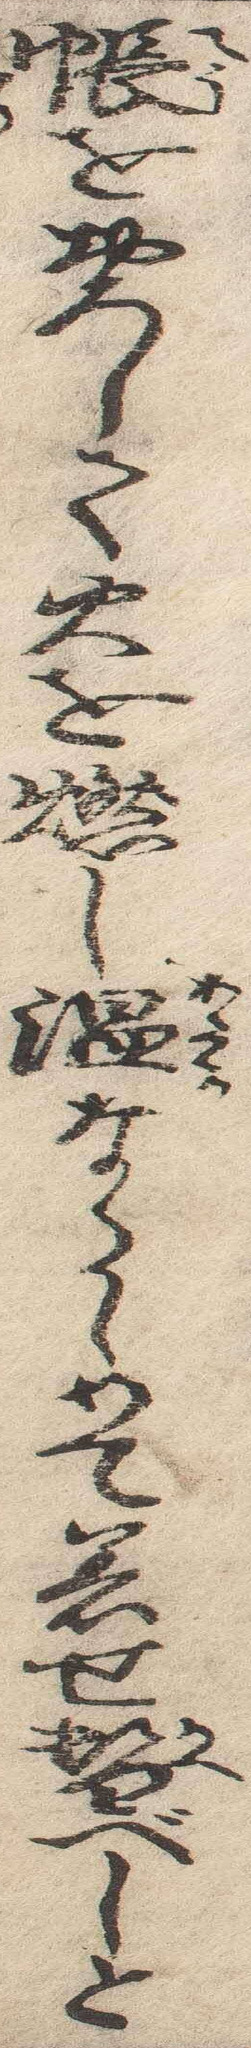帳をおろして火を燃し温ならしめて着せ替べしと

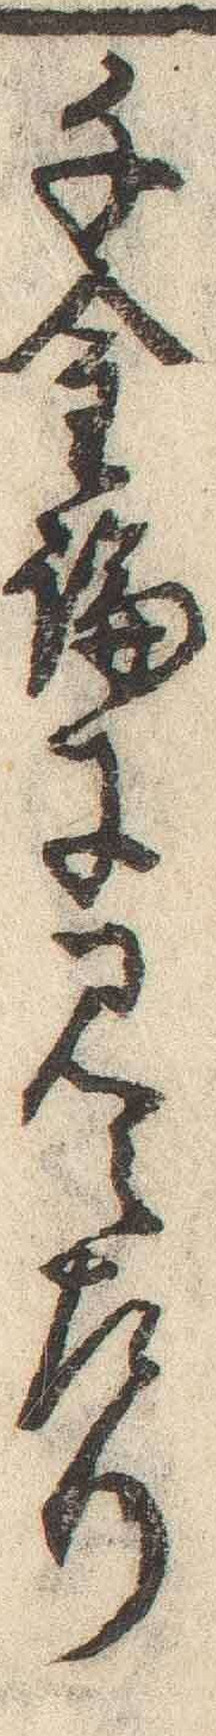千金論に見えたり
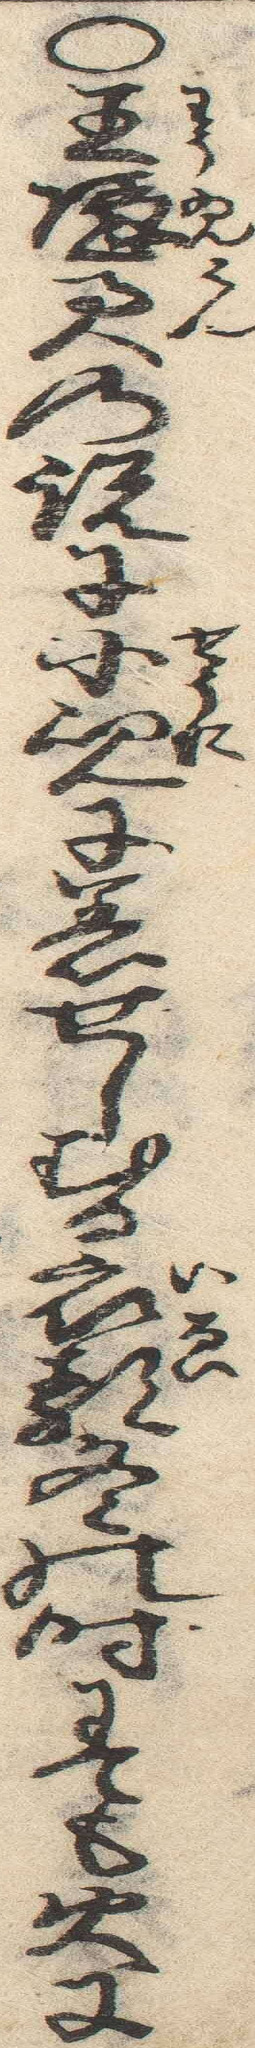◯王隠君の説に小児に着せしむる衣類冬の時にても火に
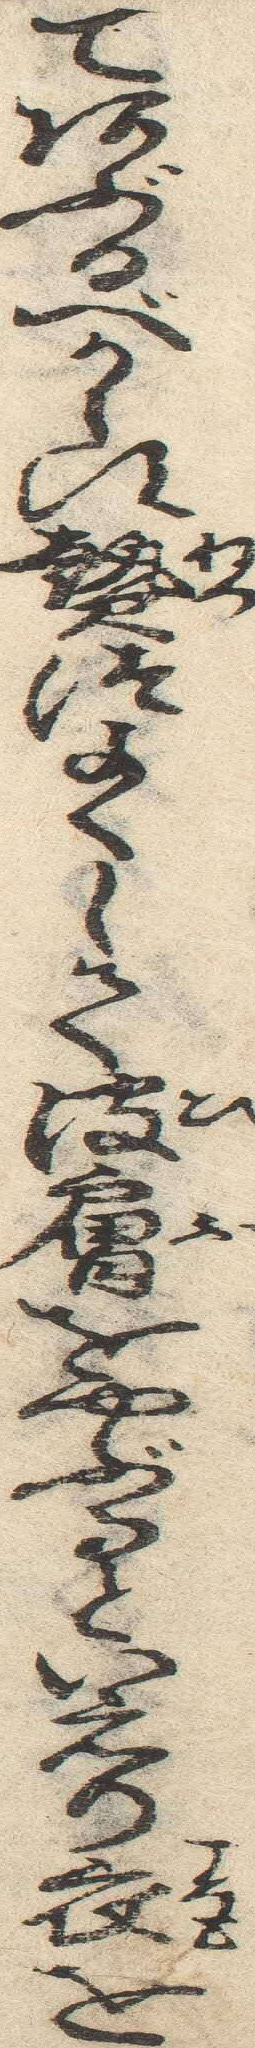てあぶるべからす熱つよくして皮膚をやぶるといえり衣を
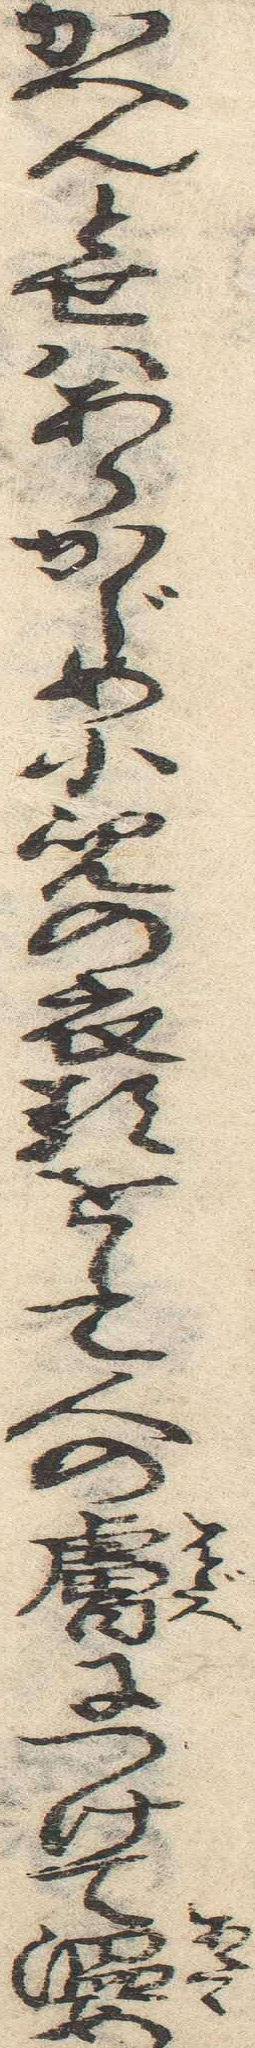かへんとせはあらかじめ小児の衣類をして人の膚につけて温め
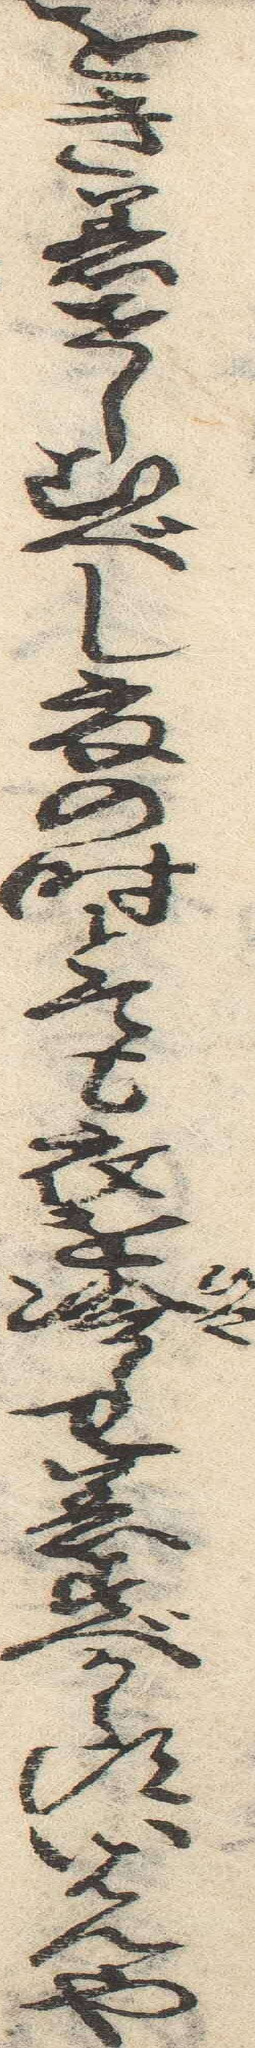をき着せしむべし夏の時とても衣を冷して着すべからすいはんや
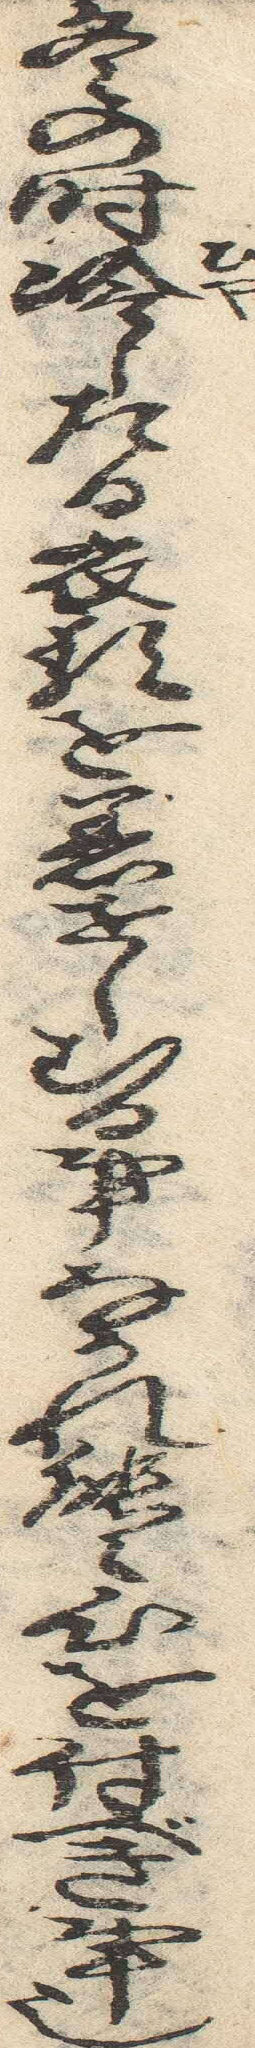冬の時冷したる衣類を着せしむる事なかれ能々心を付べき事也
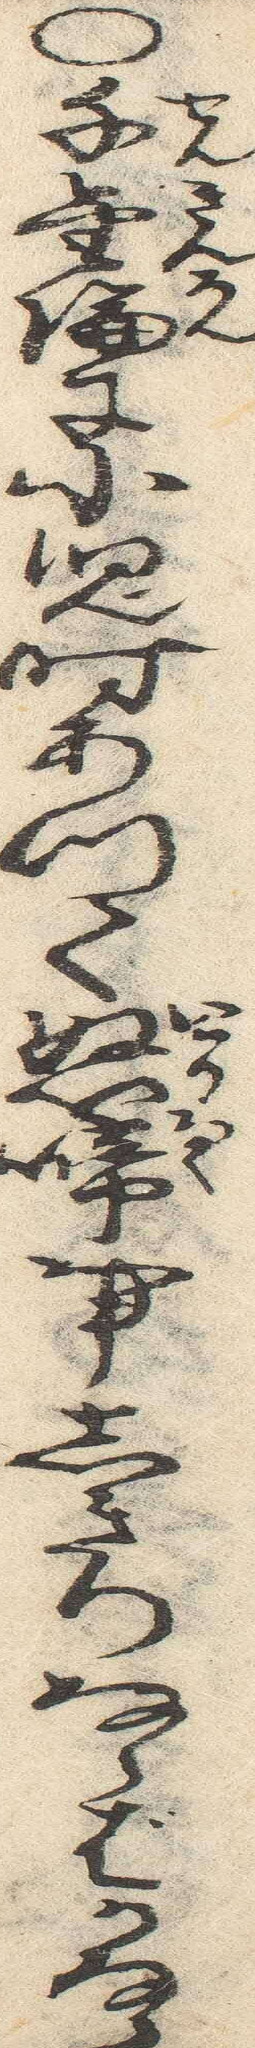◯千金論に小児時あつて怒啼事しきりならばかなら
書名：小児必用養育草
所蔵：東京学芸大学附属図書館 国文学研究資料館
